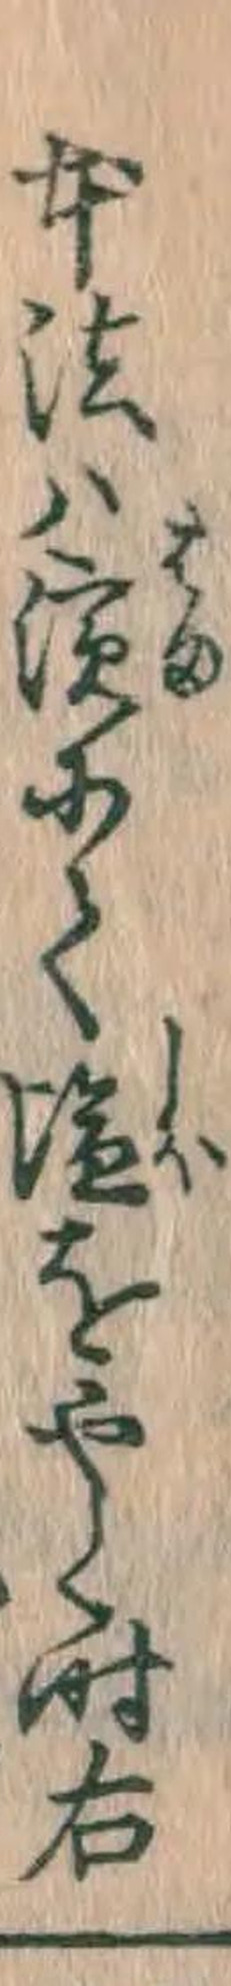本法は浜にて塩をやく時右
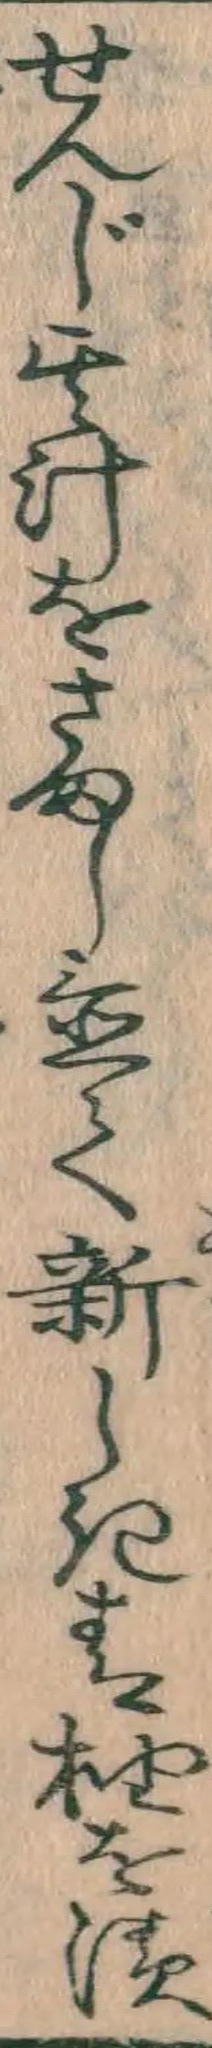せんじ其汁をさまし置て新しき青柚を漬
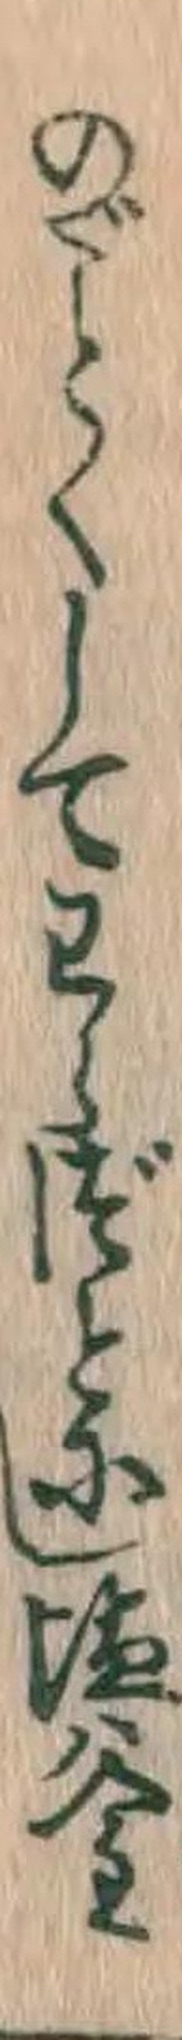のごとくしてわらづとにし塩釜
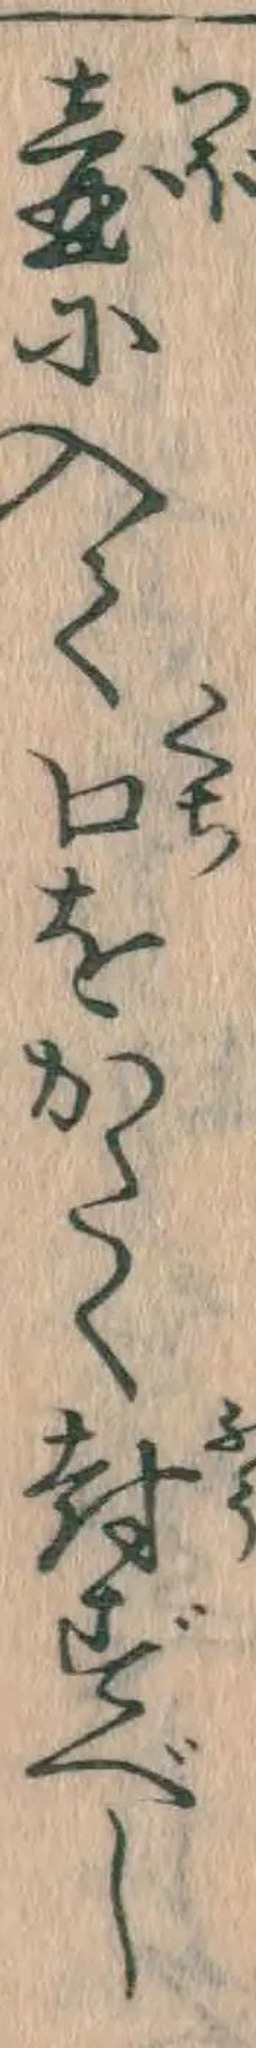壺に入て口をかたく封ずべし
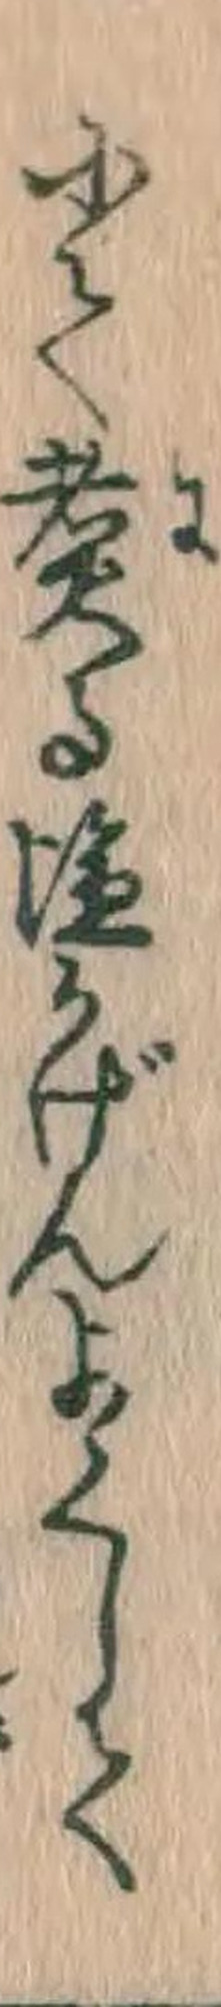にて煮る塩かげんよくして
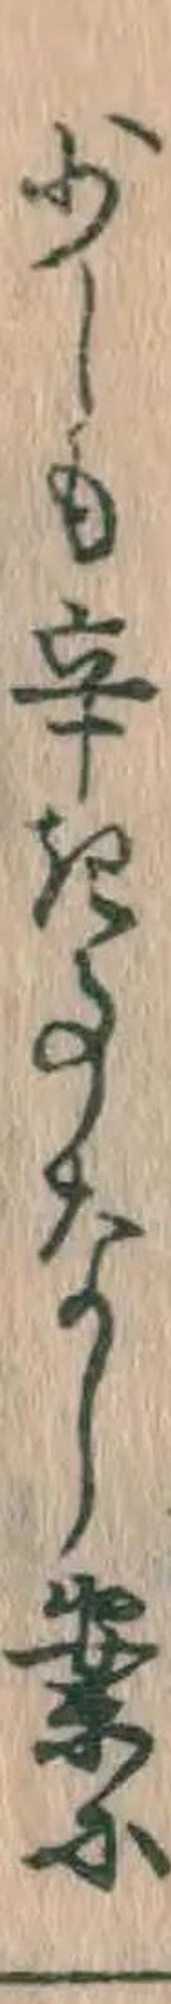少しも辛き事なし案に
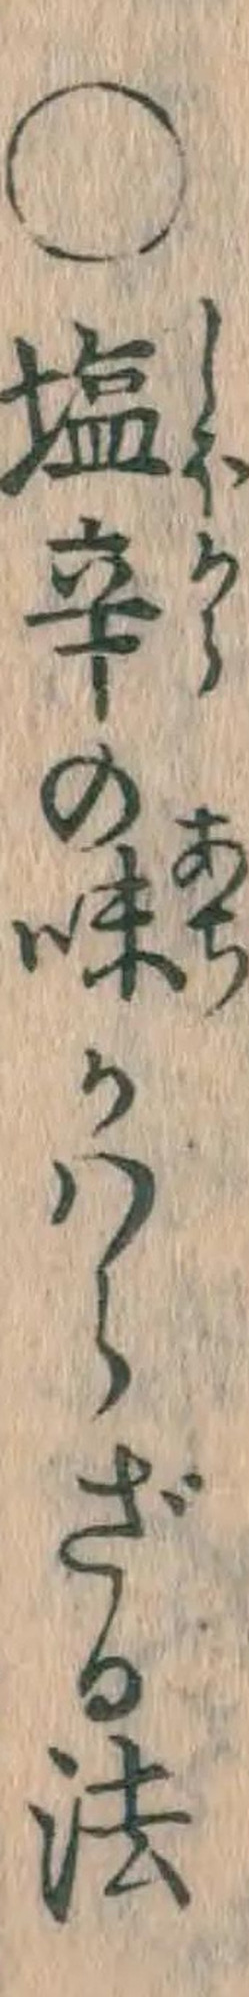○塩辛の味かはらざる法
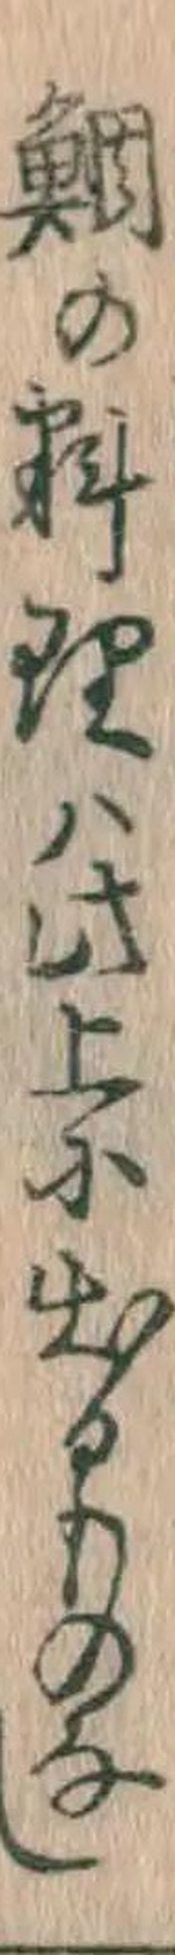鯛の料理は此上に出るものなし
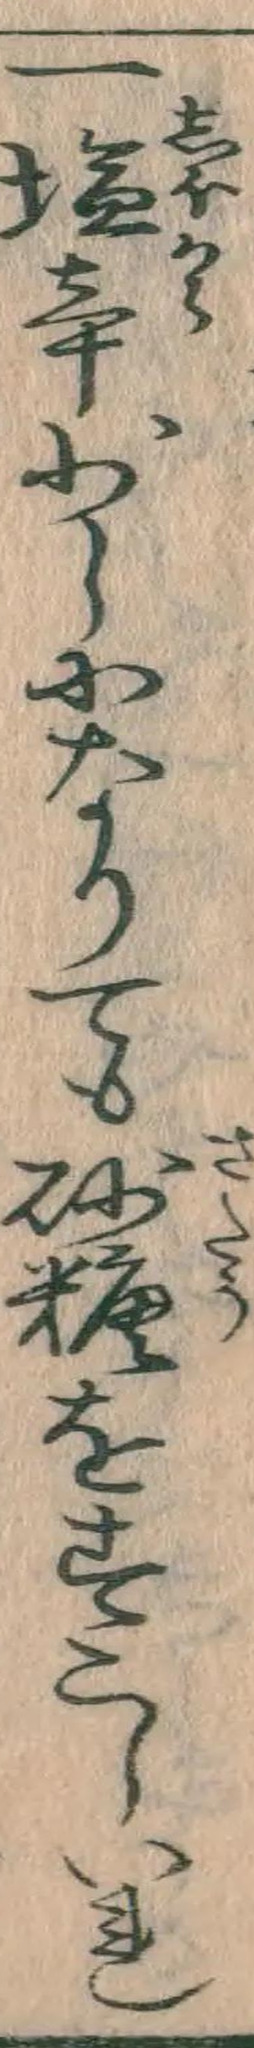一塩辛少しになりても砂糖をすこしいれ
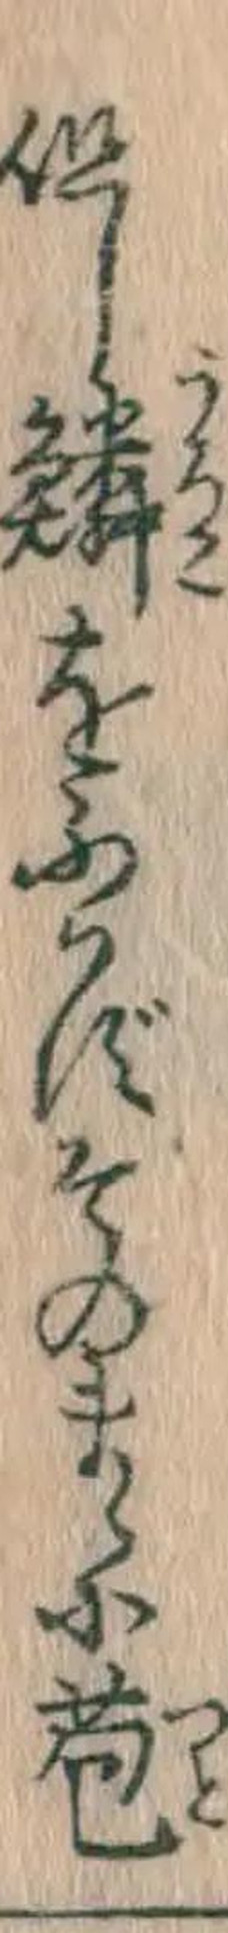但し鱗をふかずそのまゝに苞
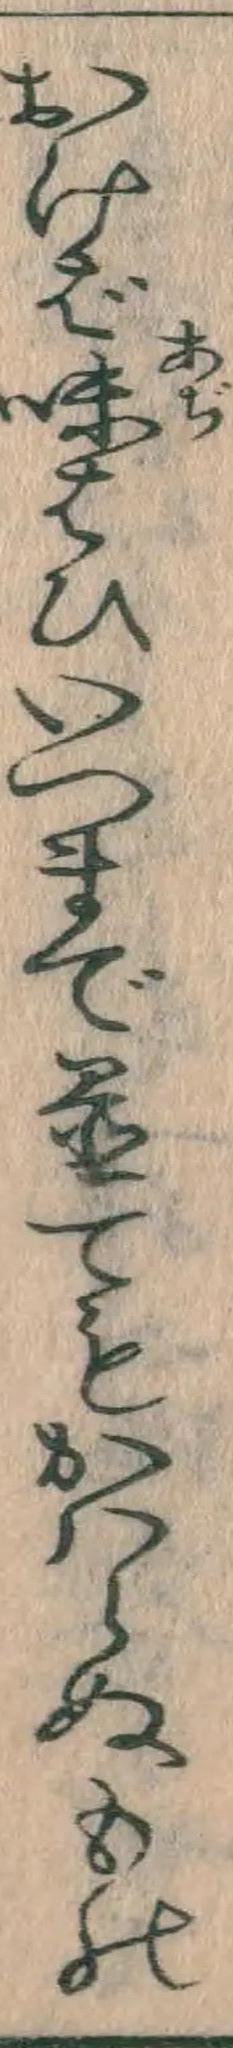おけば味はひいつまで置てもかはらぬもの
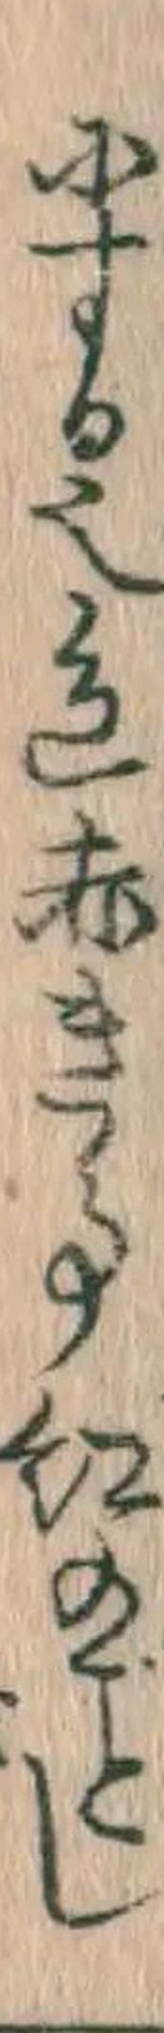にする也色赤き事紅のごとし
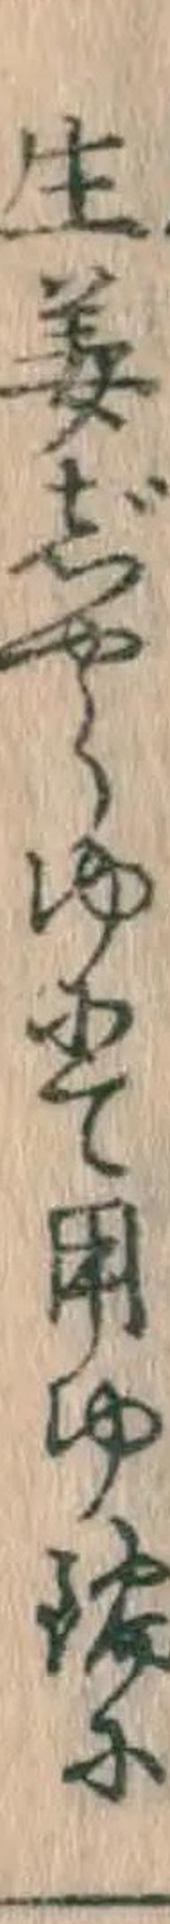生姜じやうゆにて用ゆ鍋に
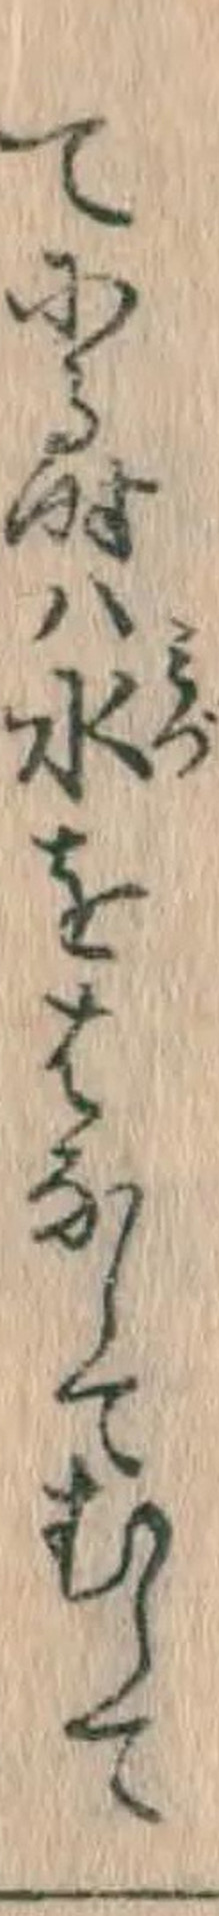てにる時は水をはなしてむして
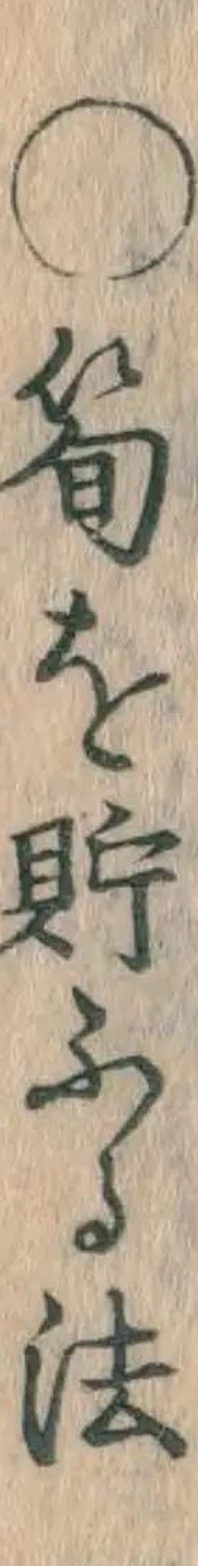○筍を貯ふる法
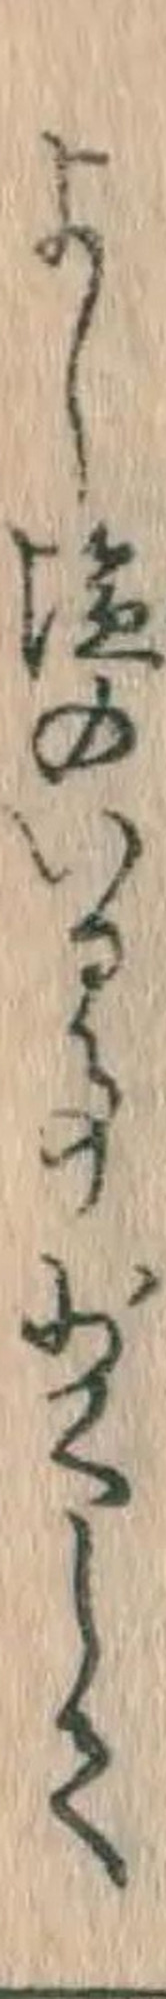よし塩のいる事少くして
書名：広益秘事大全 3巻. [5]
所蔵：国立国会図書館 National Diet Library, JAPAN
